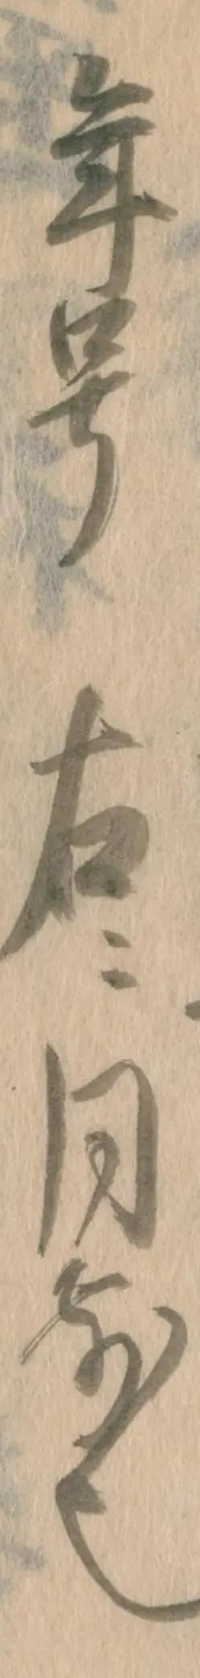年号右ニ同前也
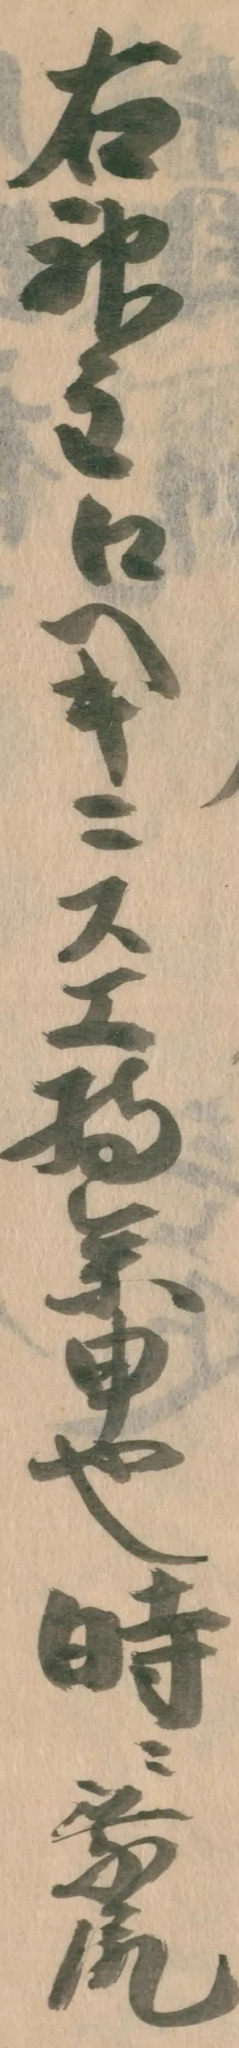右神主江ヘキニスエ持参申也時ニ乗尻
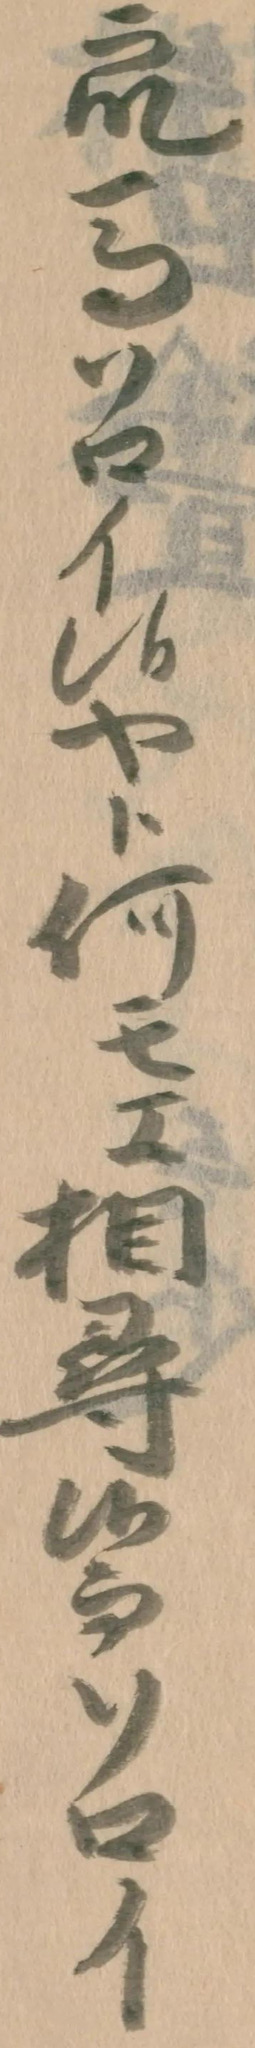衆馬ソロイ候也ト何モエ相尋候而ソロイ
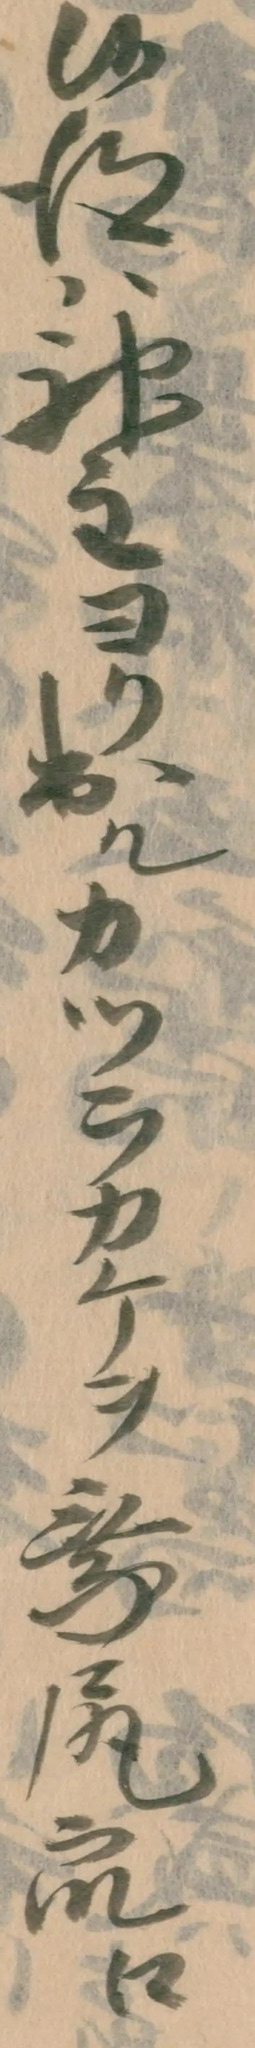候得ハ神主ヨリ出ルカツラカケヲ乗尻衆江
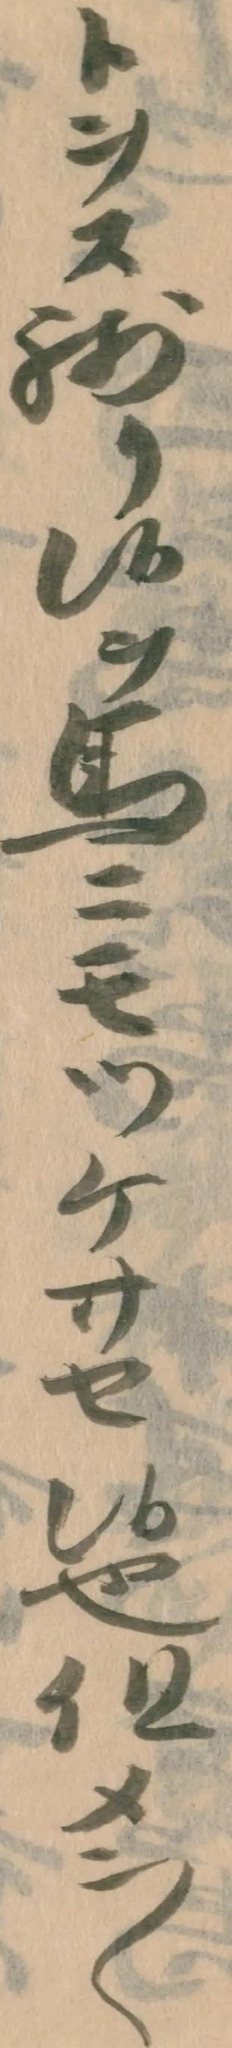トヲス残リ候ヲ馬ニモツケサセ候也但メン〳〵
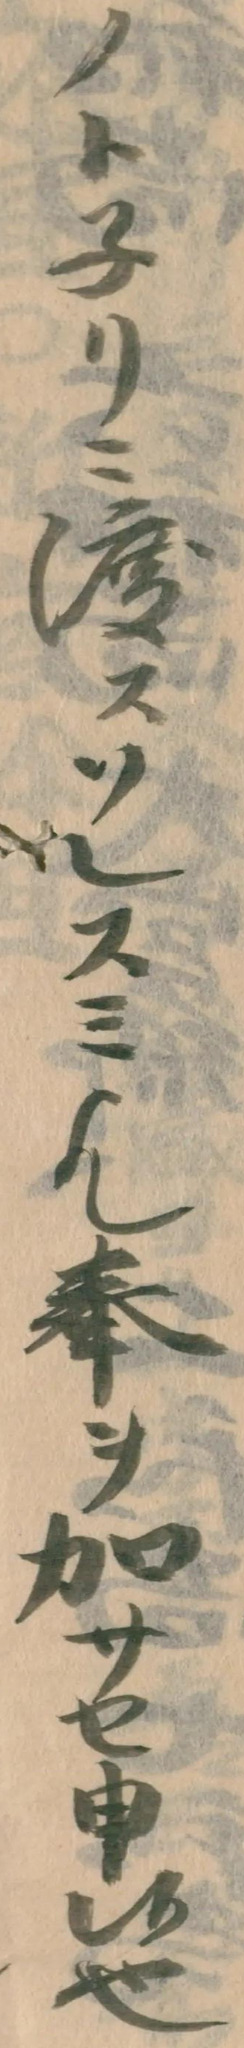ノトネリニ渡スソレスミ候て奉ヲ加サセ申候也
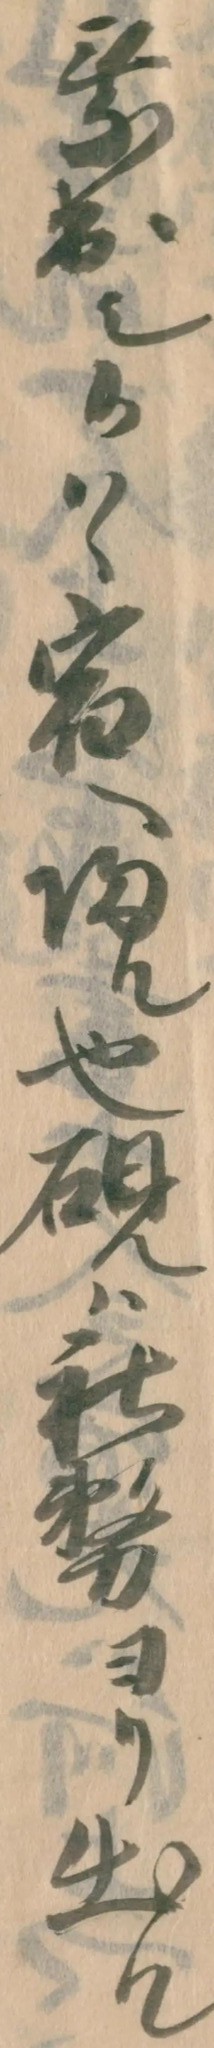乗出シ候ハヽ宿へ帰ル也硯ハ社務ヨリ出ル
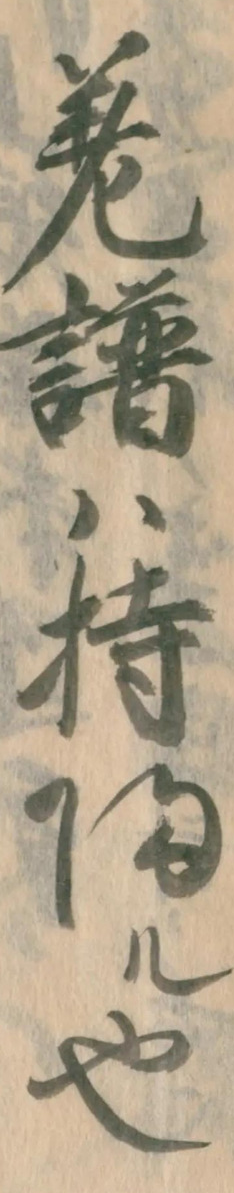差譜ハ持帰ル也
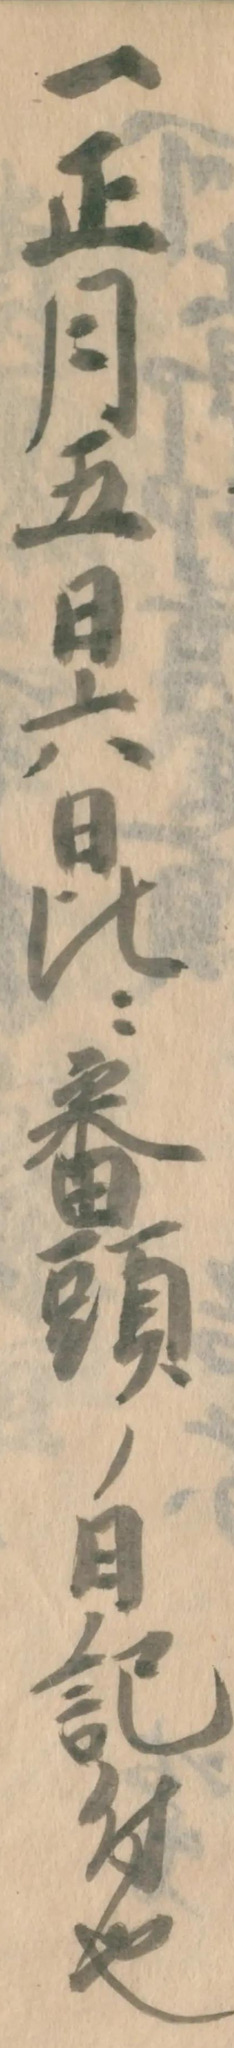一正月五日六日比ニ番頭ノ日記付也
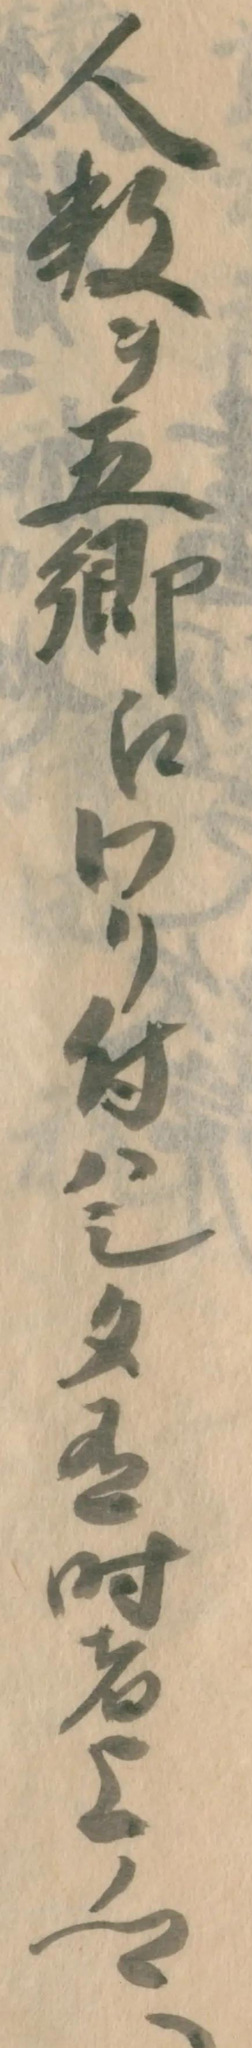人数ヲ五郷江ワリ付ハシタ有時者上ノ郷へ
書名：賀茂社記録. 第91冊
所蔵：国立国会図書館 National Diet Library, JAPAN
